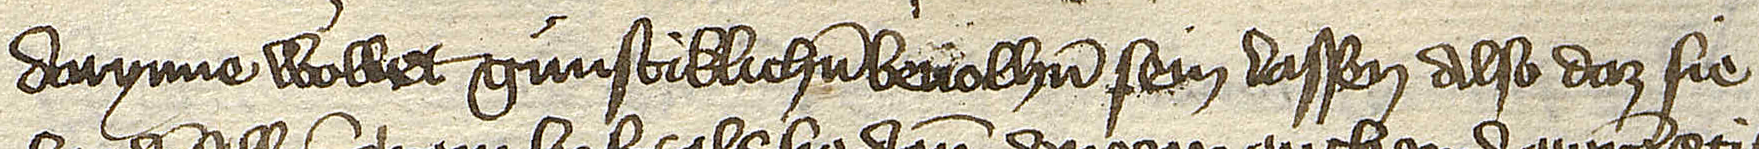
darynne wöllet günſtiklichn* beuolhn* ſein laſſen Alſo daʒ ſie
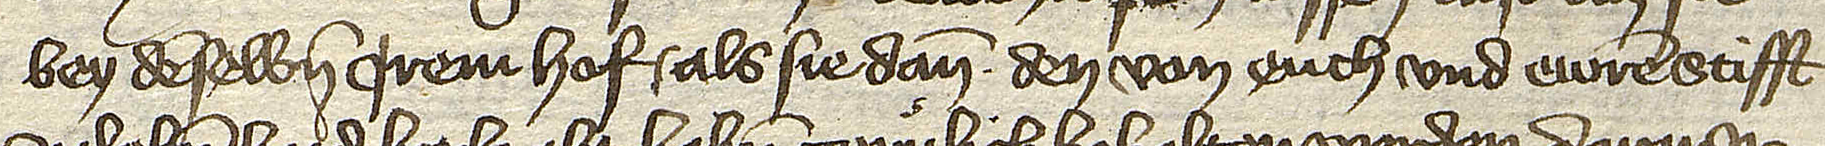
bey de*ſelbn* Irem hof / als ſie dan* . den von euch vnd ewre* Stifft
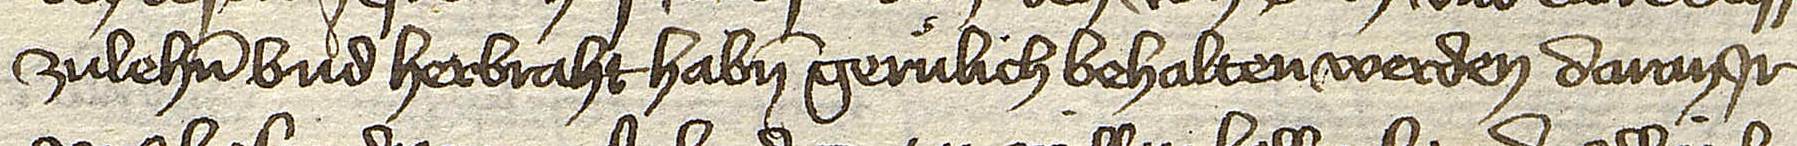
cʒulehn* vnd herbraht habn* gerülich behalten werden daran Ir
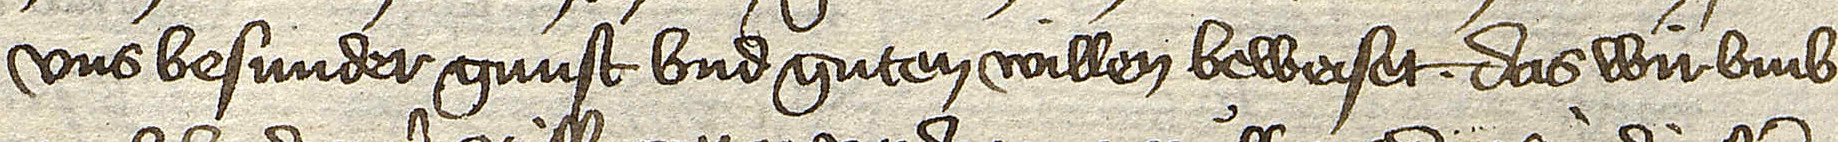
vns beſunder gunſt vnd guten willen beweiſet . das wir vmb
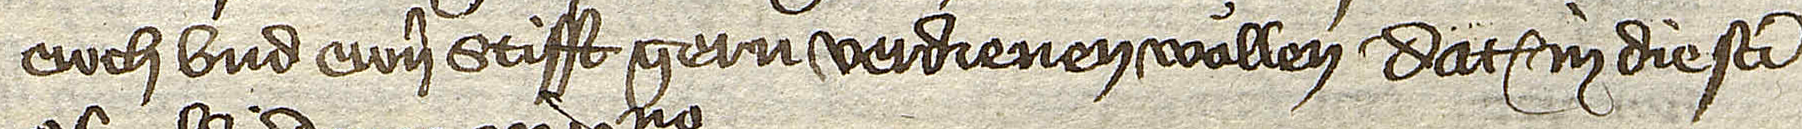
ewch vnd ew*n Stifft gern verdienen wöllen / Dat* in die ſci*
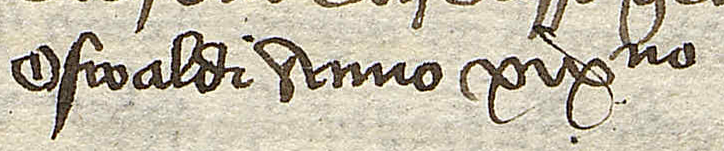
Oſwaldi Anno xix*
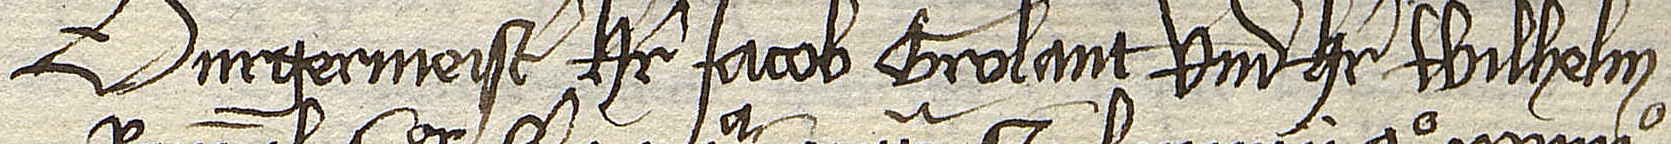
Burgermeiſt* Hr* Iacob Grolant Vnd Hr* Wilhelm
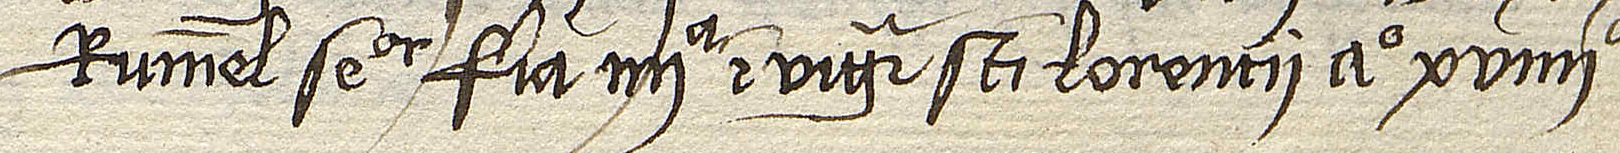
Rum*el ſe* fi*a iiii* i* vigi* ſci* lorencii a* xviiii*
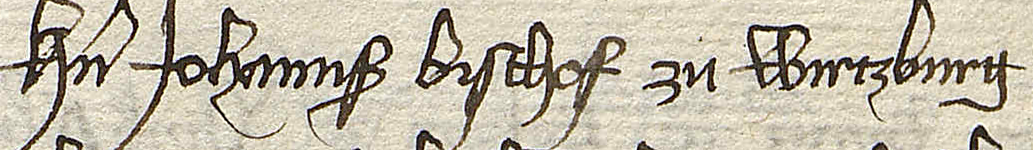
Hn* Iohannſ* biſchof ʒu Wircʒburg
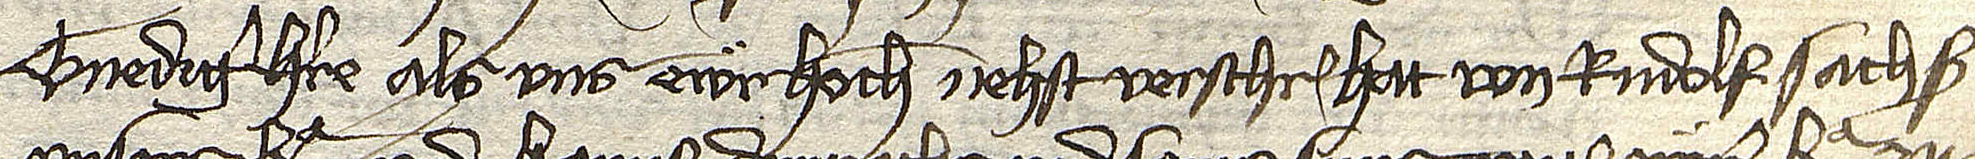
Gnedig* h*re als vns eẅr hoch* nehſt verſchr* hat von Rudolf ſachſ*
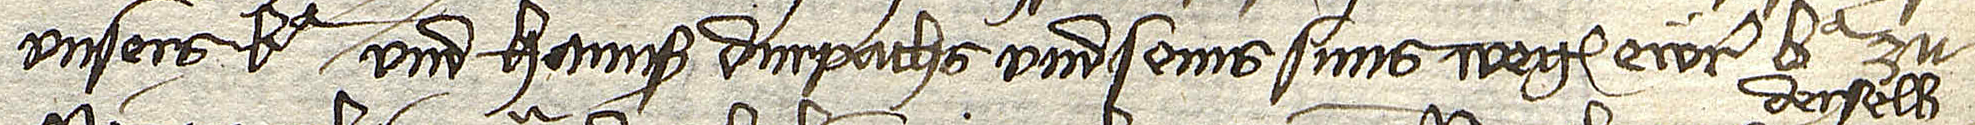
vnſers b* / vnd hannſ* durpachs vnd ſeins ſuns weg* eẅr* b* ʒu
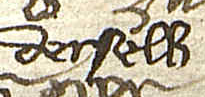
derſelb
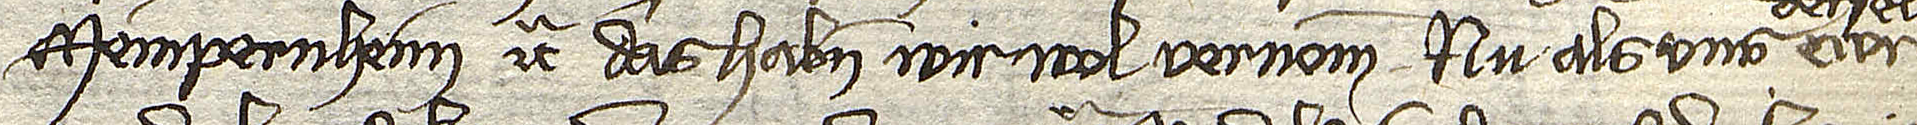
Meinpernheim ec* das habn* wir wol vernom* / Nu als vns ewr
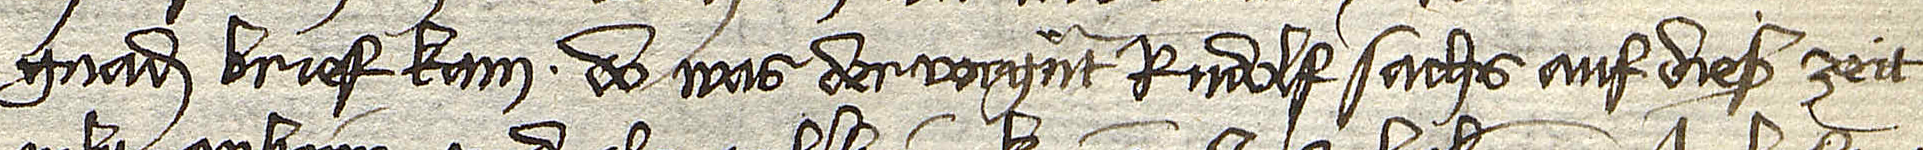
gnad* brief kam . do was der vorgent* Rudolf ſachs auf dieſ* ʒeit
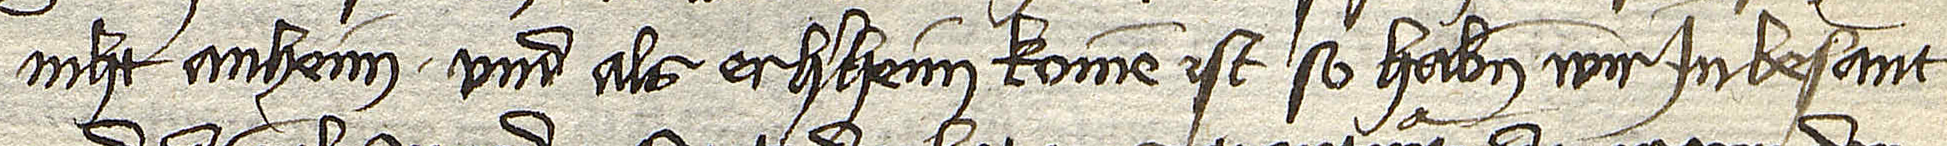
niht anheim / vnd als er h*heim kome* iſt ſo habn* wir In beſant
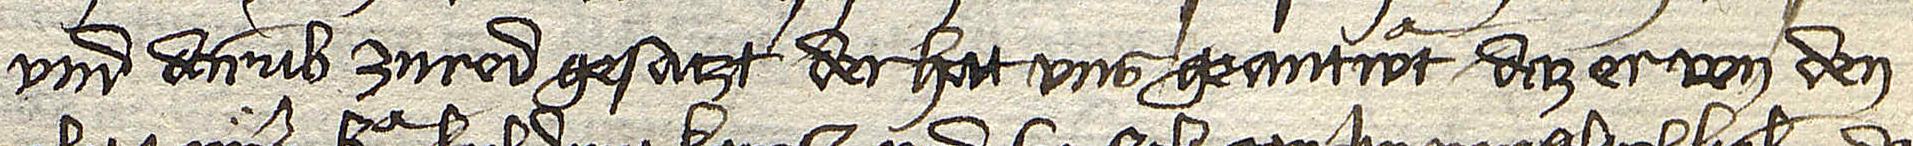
vnd darub* ʒured geſacʒt der hat vns geantw*t / daʒ er von den
